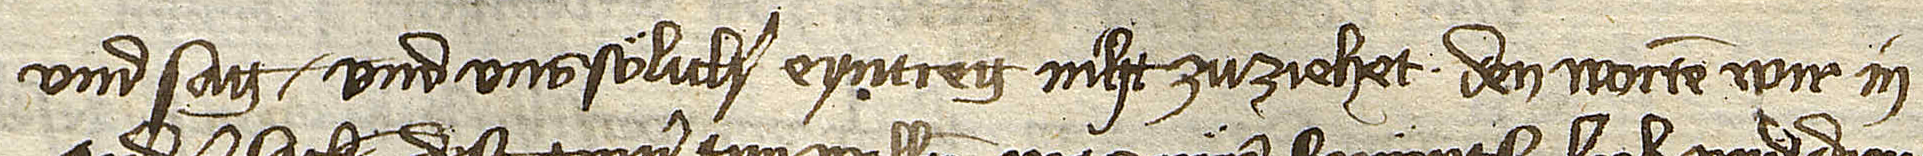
vnd ſag / vnd vns ſölich* eyntreg niht ʒu ʒiehet . den worte* wir in
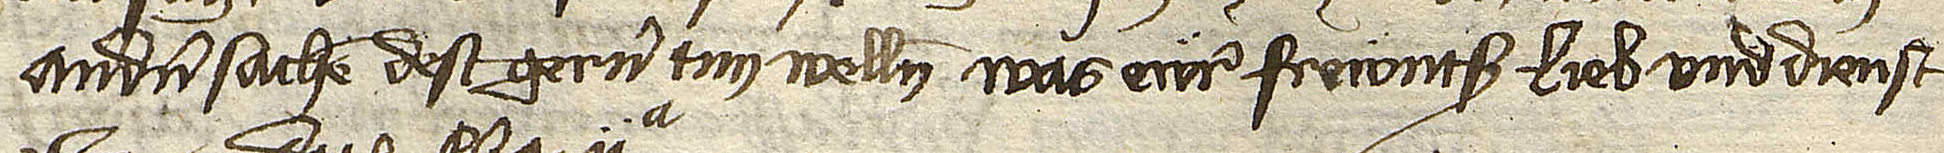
andn* ſache* deſt gern* tun welln* was eẅr* freẅntſ* lieb vnd dienſt
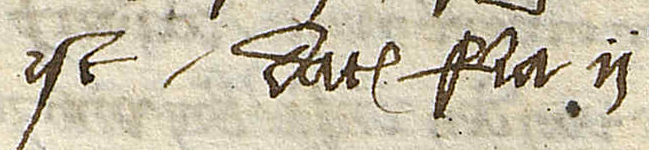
iſt / Dat* fi*a ii*
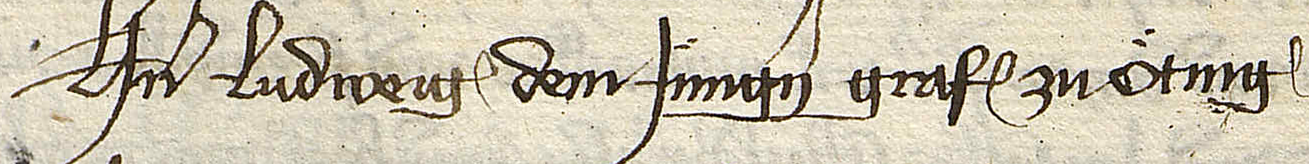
Hn* Ludweig* dem Iüng*n graf* ʒu Öting*
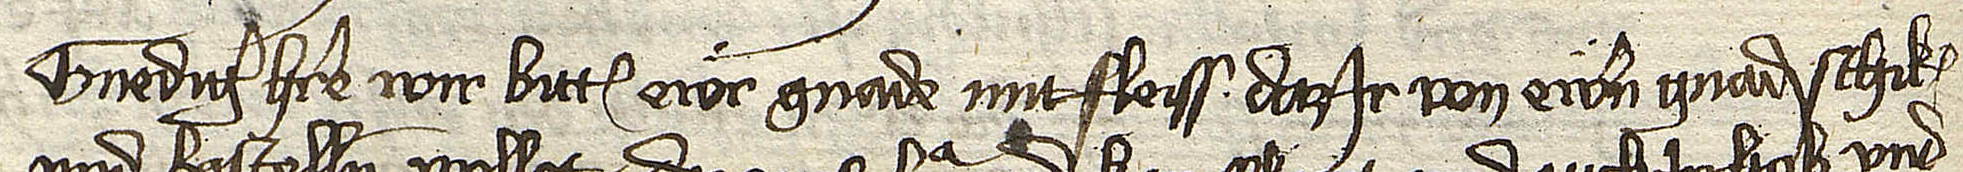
Gnedig* h*re wir bitt* eẅr gnade mit fleiſſ . daʒ Ir von eẅ*n gnad* ſchik*
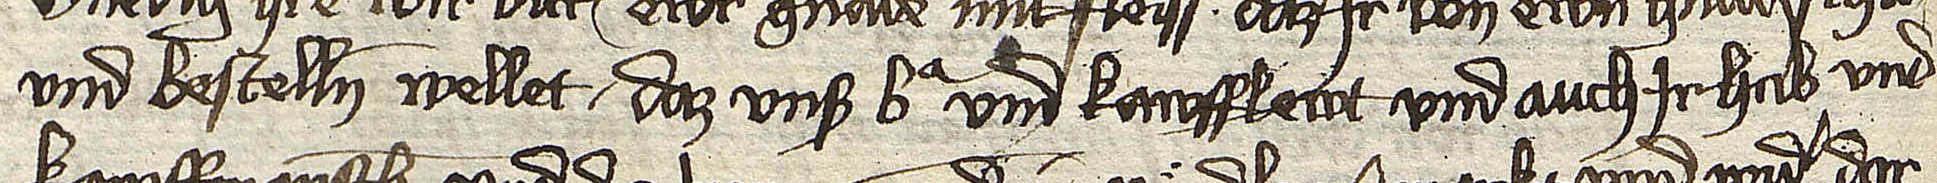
vnd beſtelln* wellet / daʒ vnſ* b* vnd kawfflewt vnd auch Ir hab vnd
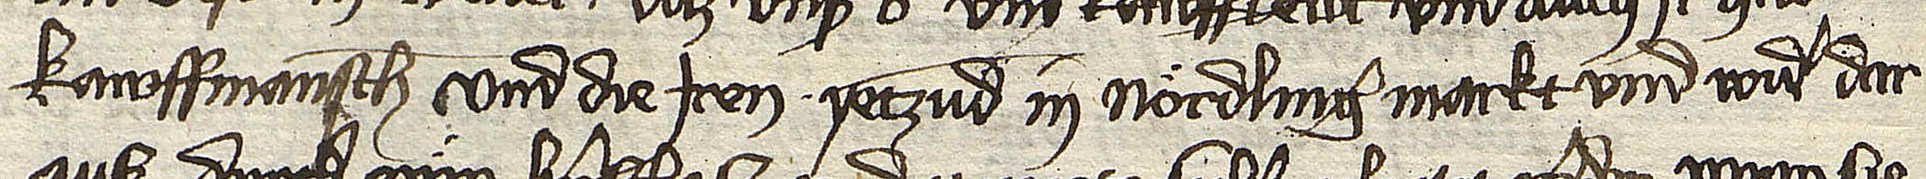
kawffmanſch* vnd die Iren . yecʒu*d in Nördling* markt vnd wid* dar
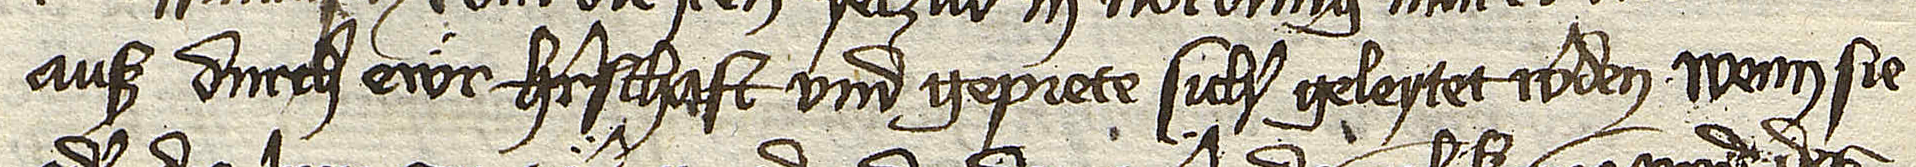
auſʒ durch eẅr h*rſchaft vnd gepiete ſich* geleytet w*den . wenn ſie
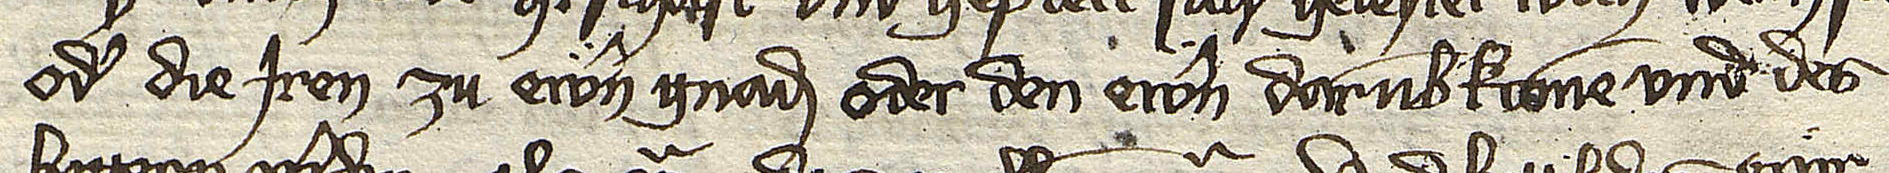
od* die Iren ʒu eẅ*n gnad* oder den eẅ*n darub* kome* vnd des
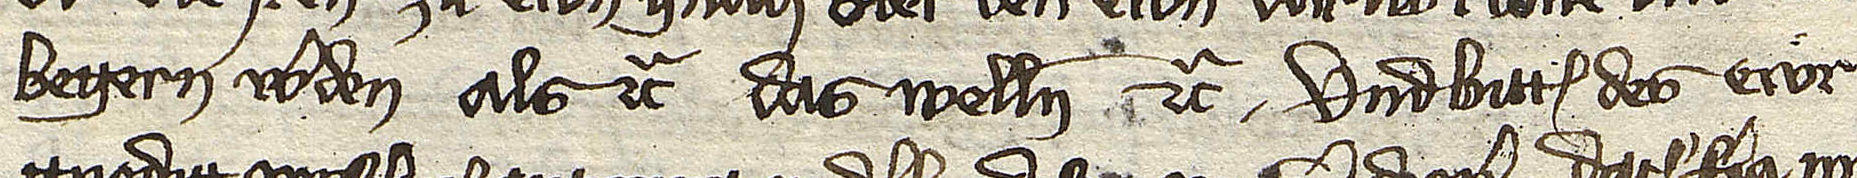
begern w*den als ec* das welln* ec* / Vnd bitt* des eẅr
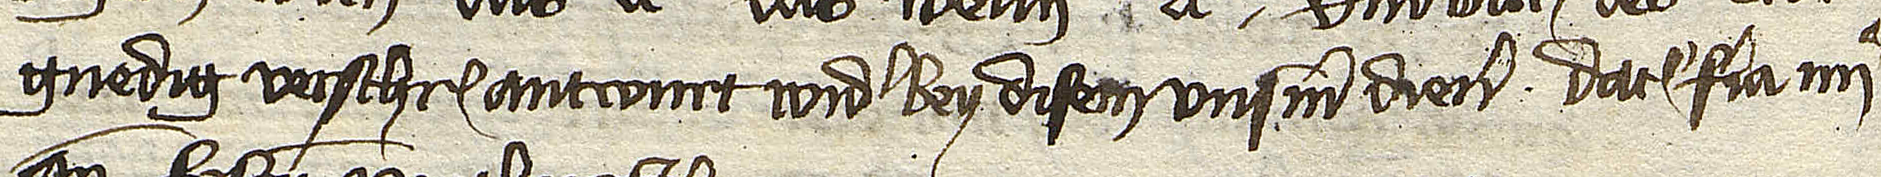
gnedig* verſchr* antwurt wid* bey diſem vnſm* dien* . dat* fi*a iiii*
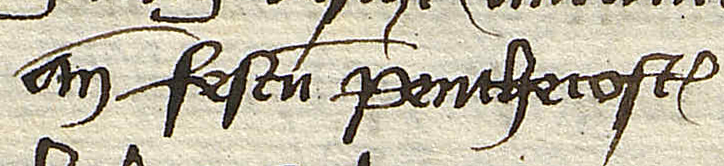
an* feſtu* Penthecoſt*
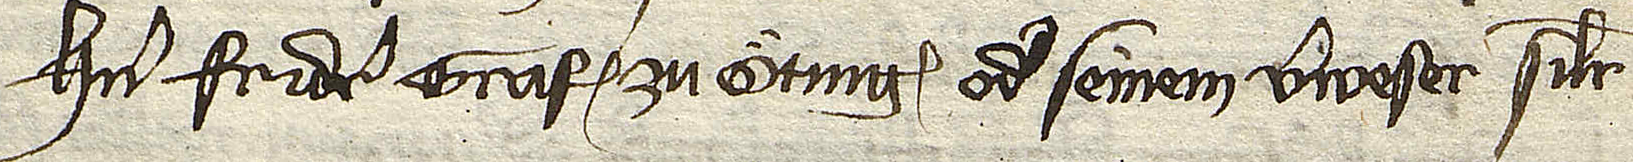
Hn* fridr* Graf* ʒu Öting* od* ſeinem v*weſer ſilr*
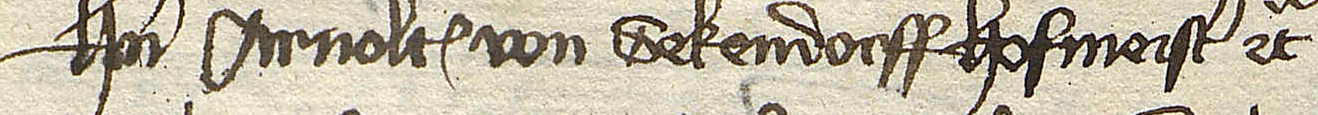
Hn* Arnolt von Sekendorff Hofmeiſt* ec*
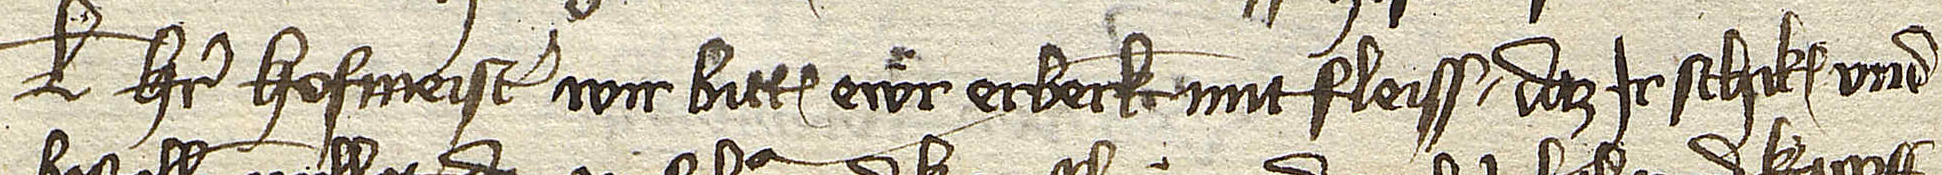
L* Hr* Hofmeiſt* wir bitt* eẅr erberk* mit fleiſſ / Daʒ Ir ſchik* vnd
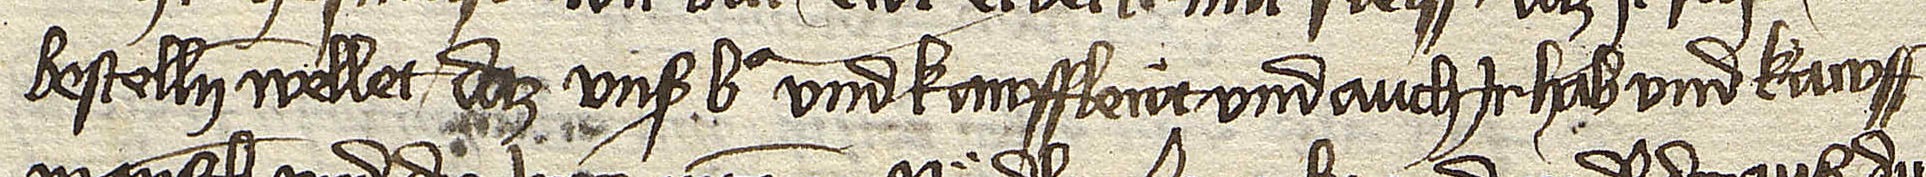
beſtelln* wellet daʒ vnſ* b* vnd kawffleẅt vnd auch Ir hab vnd kawff
